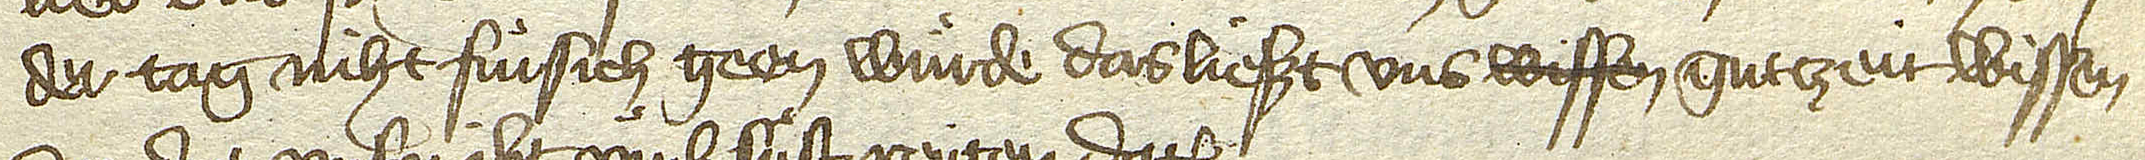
der tag niht fürſich geen würde das lieſʒt vns wiſſen gutcʒeit wiſſen
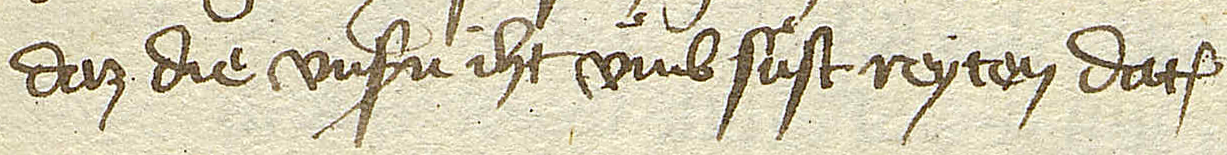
daʒ die vnſ*n iht v̈mb ſüſt reyten dat*
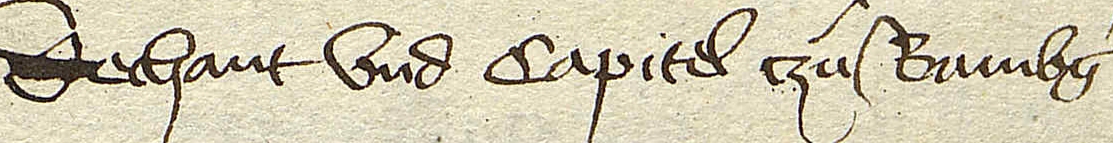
Dechant vnd Capitel cʒü Bambg*
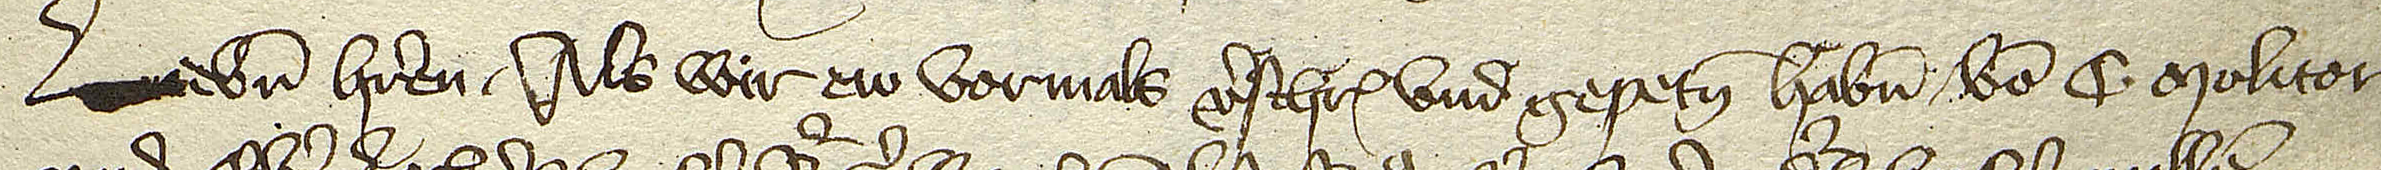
L%%ebn* hr*en / Als wir ew vormals v*ſchr* vnd gepetn* habn* / vo* C . Molitor
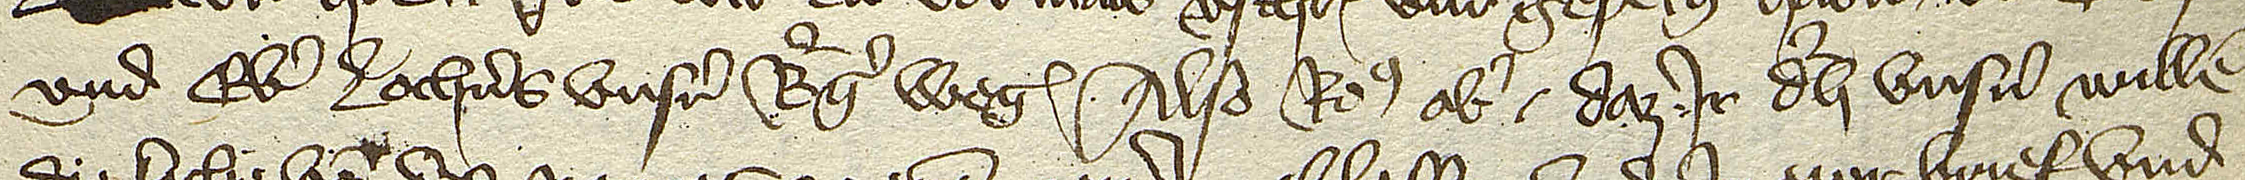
vnd Eb* Lochn*s vnſr* B*g* weg* Alſo Ro* ab* / daʒ Ir d*h vnſn* wille*
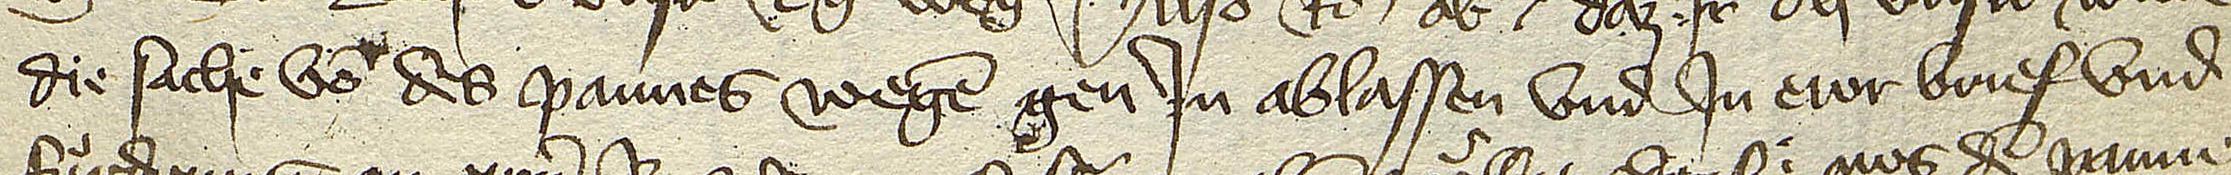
die ſache vo* des pannes wege* gen In ablaſſen vnd In ewr brief vnd
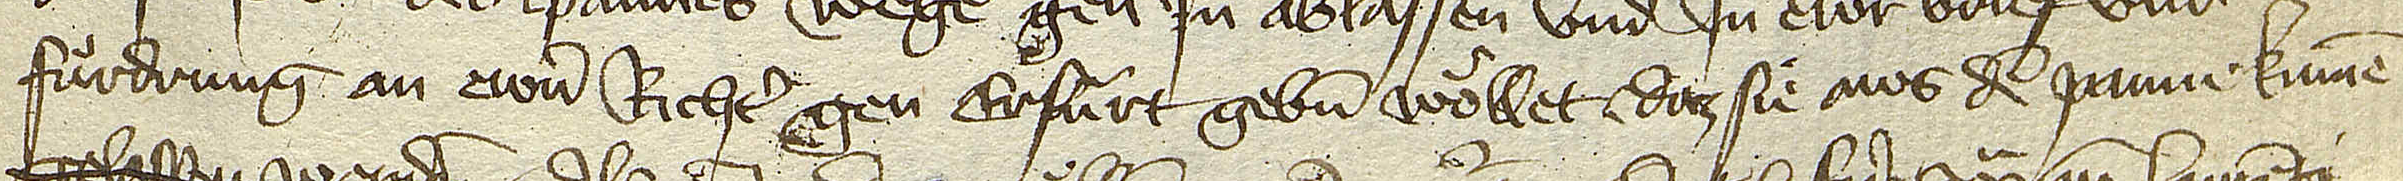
fürdrung an ewn* Richt* gen Erfürt gebn* wöllet / daʒ ſie aws d* panne kume*
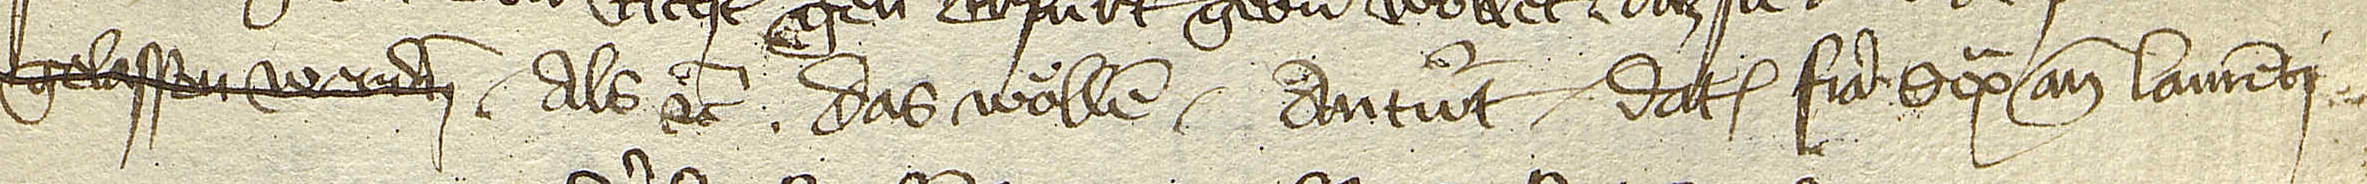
gelaſſen werdn* / Als ec* . Das wölle* / Antw*t / dat* fia* Sex* an* laure*ci
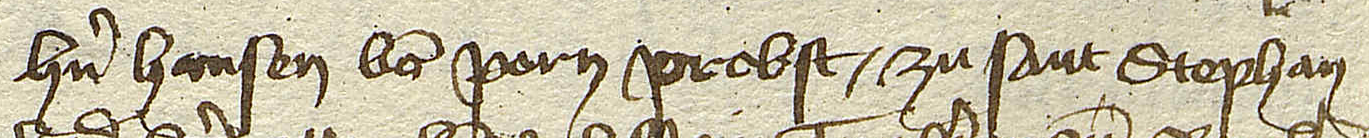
hn* hanſen vo* porn probſt / cʒu ſant Stephan
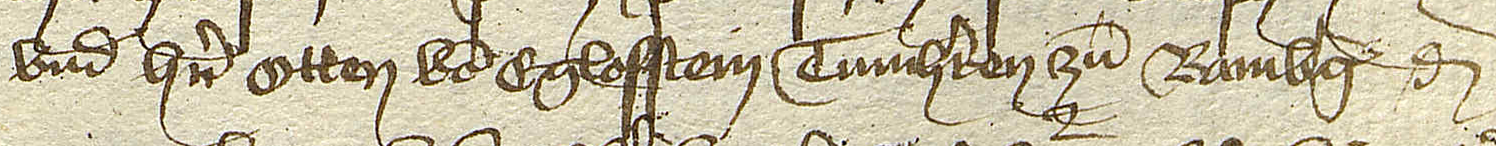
vnd hn* Otten vo* Eglofſtein Tumh*ren cʒu* Bambg* %
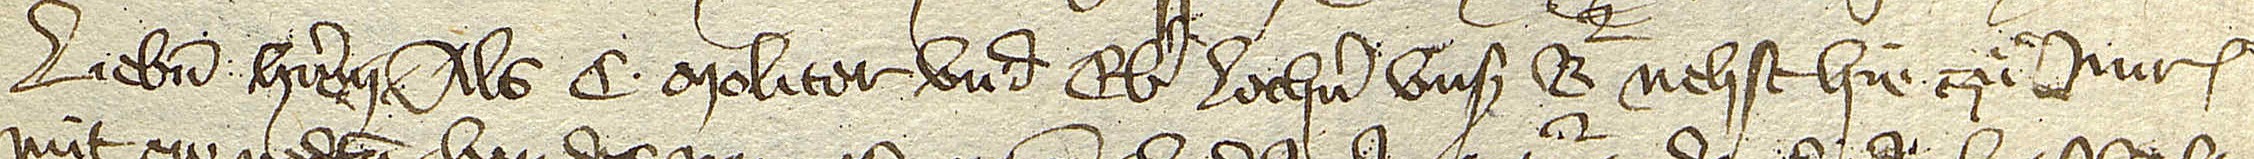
Liebn* hr*en / Als C . Molitor vnd Eb* Lochn* vnſ* B* nehſt hie cʒü Nur*
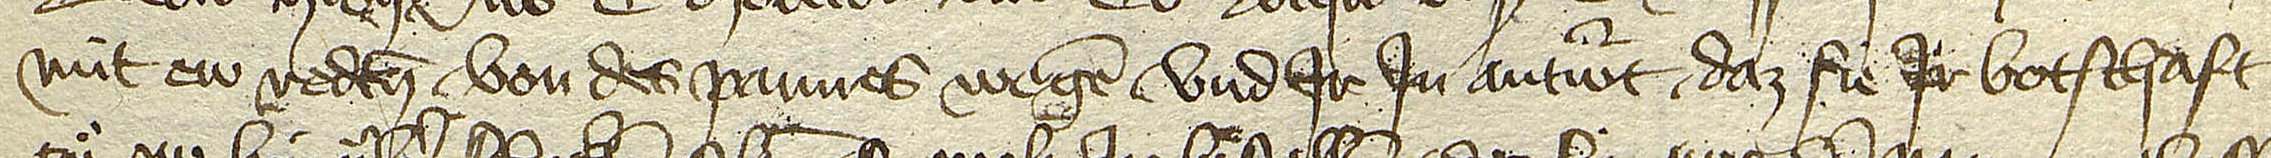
mit ew redtn* / von des pannes wege* / vnd Ir In antw*t / daʒ ſie Ir botſchaft
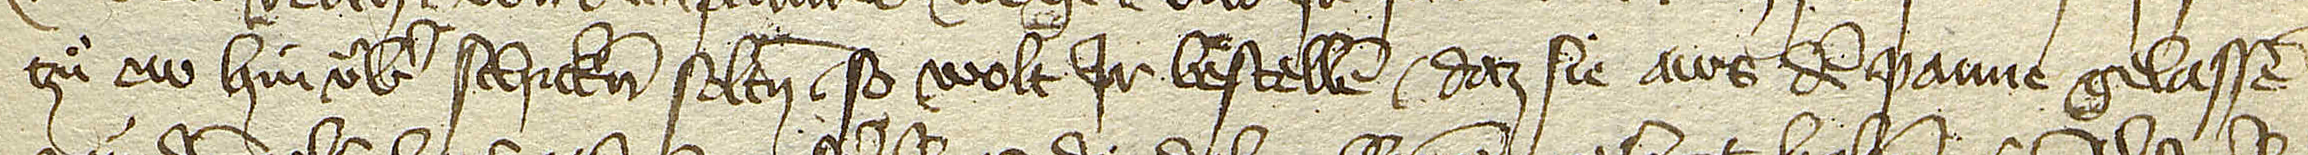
cʒü ew hin v̈b* ſchickn* ſoltn* / ſo wolt Ir beſtelle* / daʒ ſie aws d* panne gelaſſe*
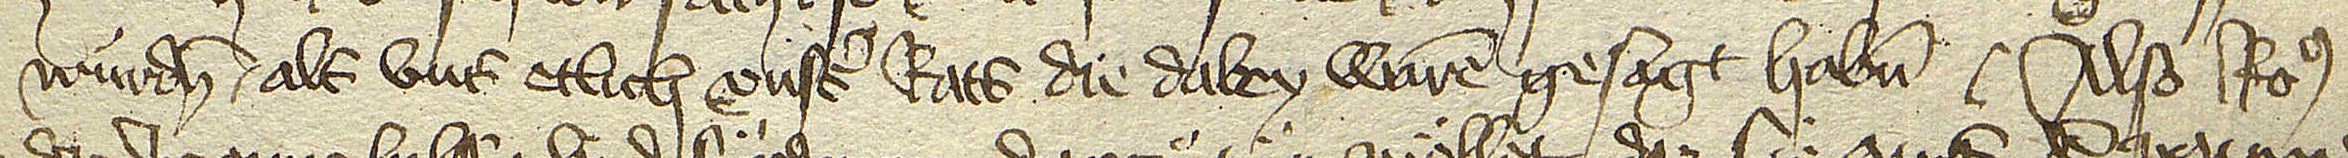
würdn* / als vns etlich vnſs* Rats die dabey ware* geſagt habn* / Alſo Ro*
